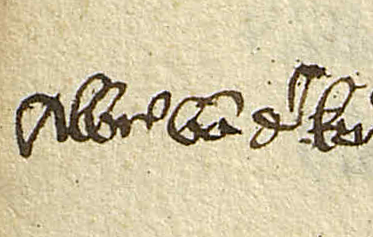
Albr* vo* d* ker
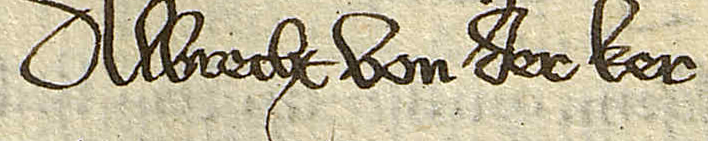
Albrecht von der ker
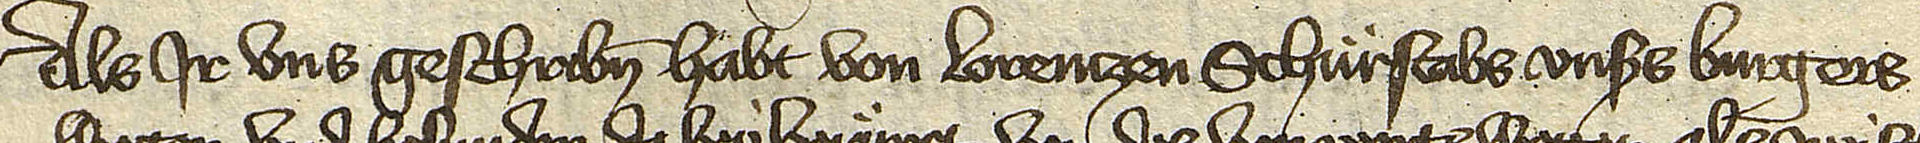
Als Ir vns geſchribn* habt von Lorencʒen Schürſtabs vnſ*s burgers
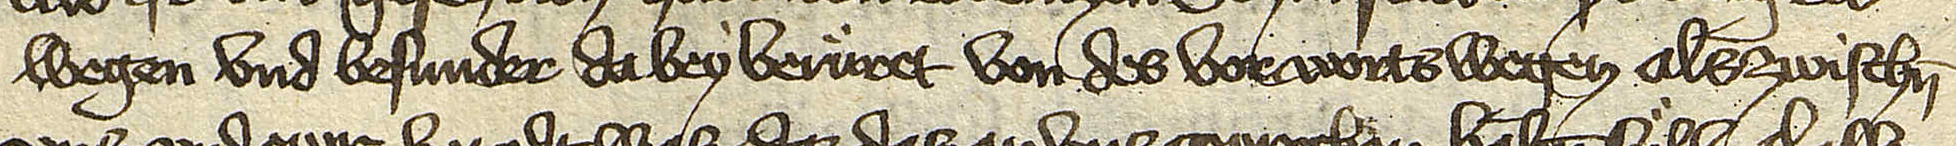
wegen vnd beſunder dabey berüret von des vor worts wegen als ʒwiſchn*
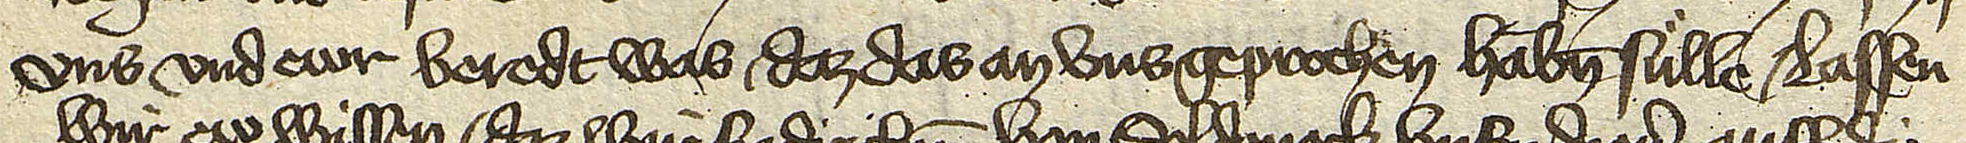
vns vnd ewr beredt was / daʒ das an vns geprochen habn* ſülle / Laſſen
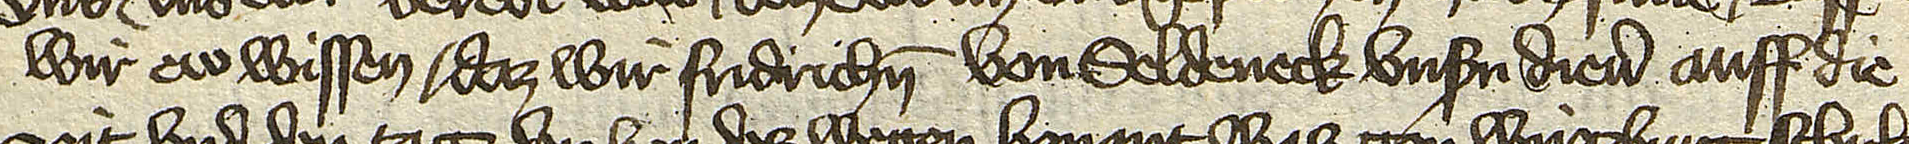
wir ew wiſſen / daʒ wir fridrichn* von Seldeneck vnſ*n dien* auff die
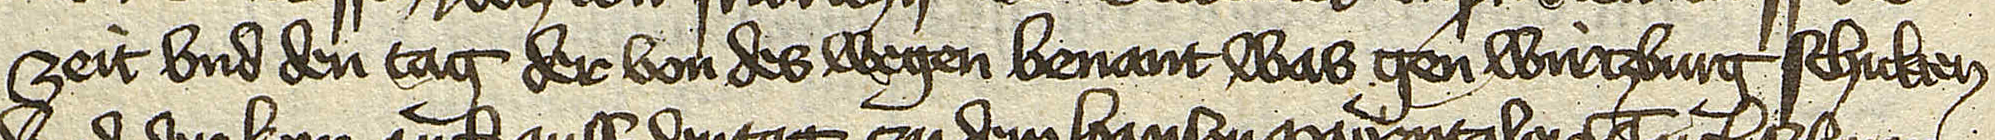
cʒeit vnd den tag der von des wegen benant was gen wircʒburg ſchickten
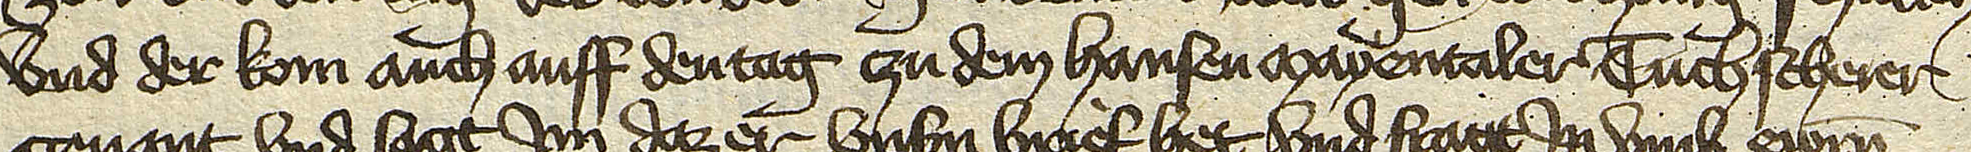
vnd der kom auch auff den tag cʒu dem hanſen Mayentaler Tuchſcherer
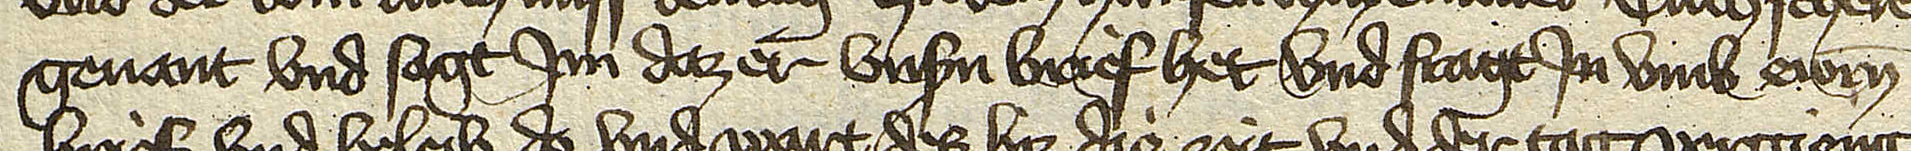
genant vnd ſagt Im daʒ er vnſ*n brief het vnd fragt In vmb ewrn*
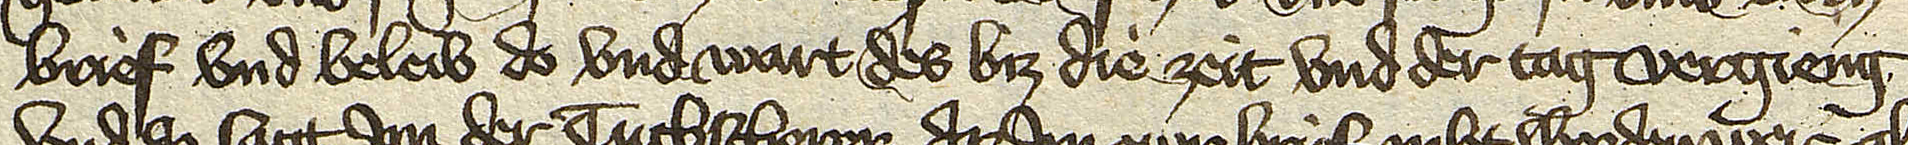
brief vnd beleib do vnd wart des biʒ die ʒeit vnd der tag vergieng
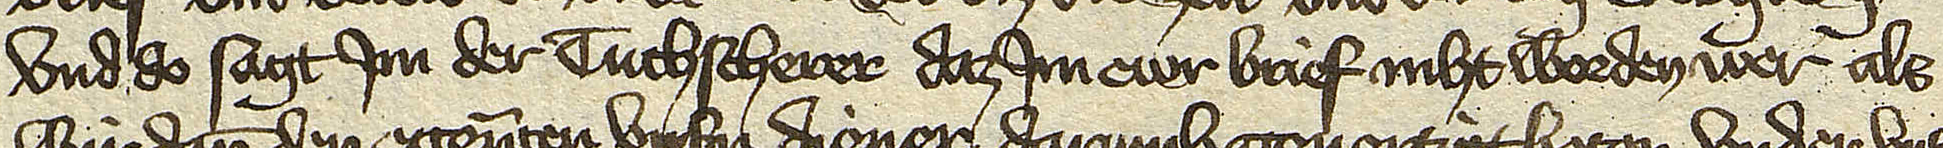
vnd do ſagt Im der Tuchſcherer daʒ Im ewr brief niht worden wer als
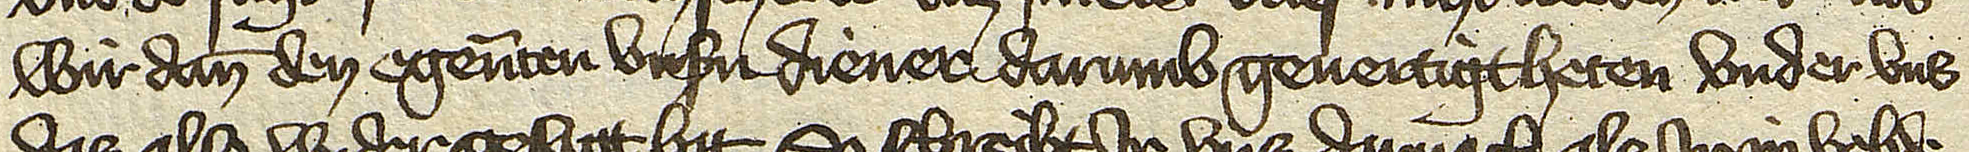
wir dan* den egenten* vnſ*n diener darumb geuertigt heten vnd er vns
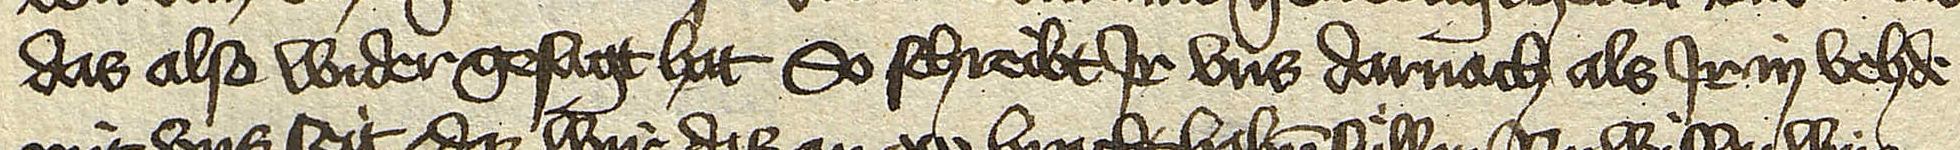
das alſo wider geſagt hat So ſchreibt Ir vns darnach als Ir in vehde
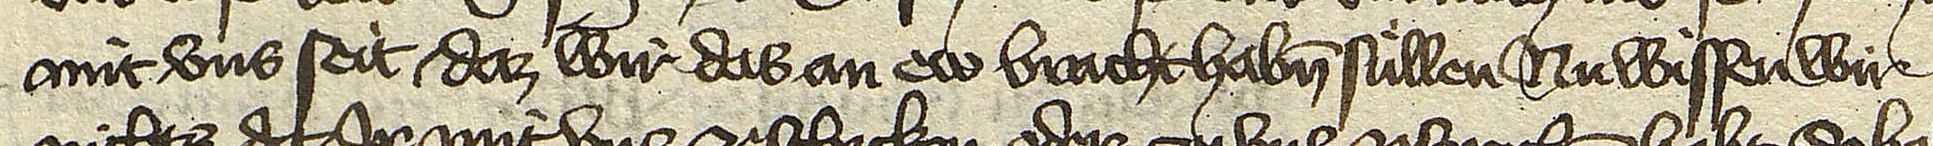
mit vns ſeit / daʒ wir das an ew bracht habn* ſüllen Nu wiſſen wir
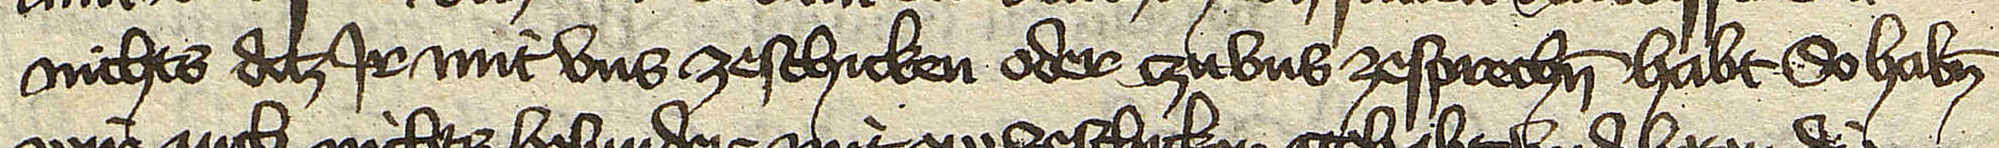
nichts daʒ Ir mit vns cʒeſchicken oder cʒu vns cʒeſprechn* habt So habn*
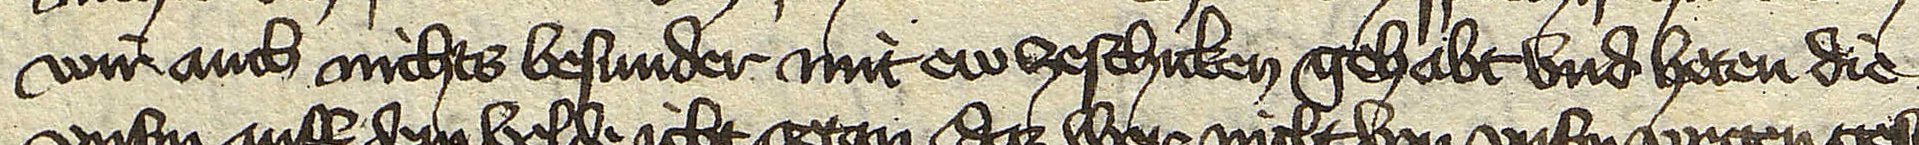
wir auch nichts beſunder mit ew cʒeſchicken gehabt vnd heten die
